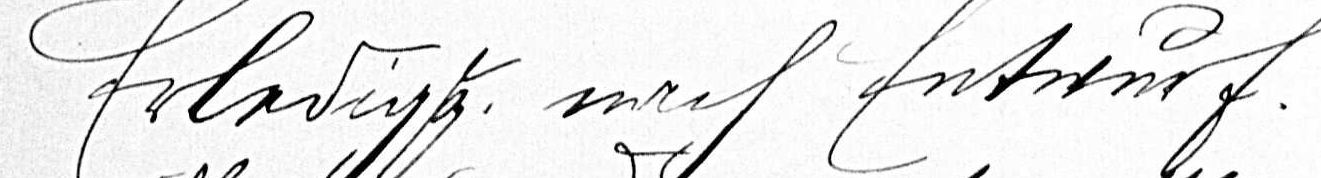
Erledigg. nach Entwurf.
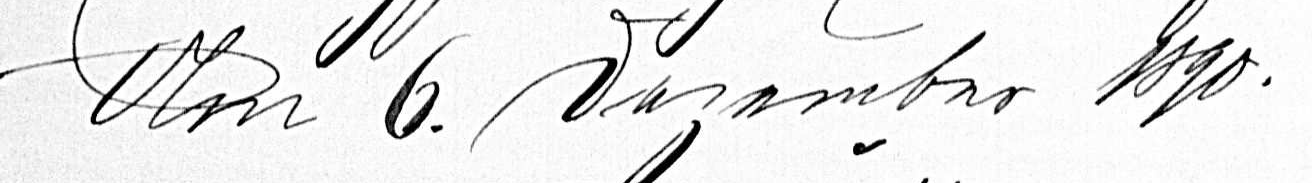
Am 6. Dezember 1890.
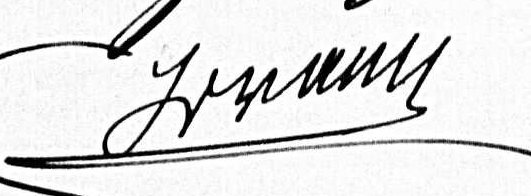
Braun
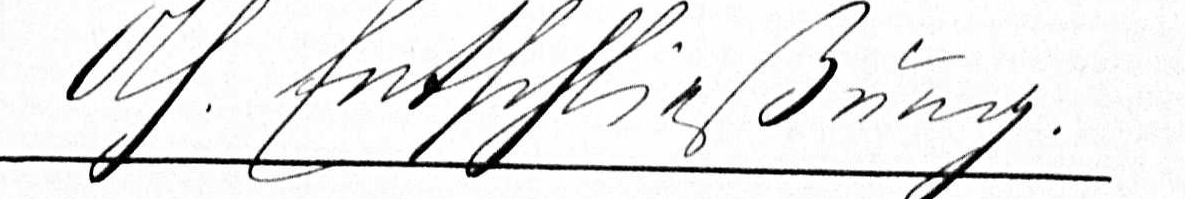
Ah. Entschließung.
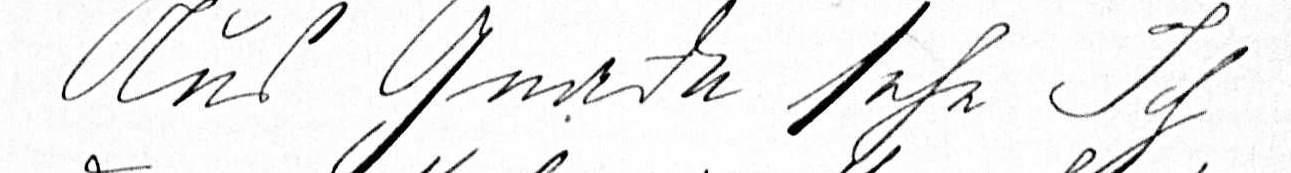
Aus Gnade sehe Ich
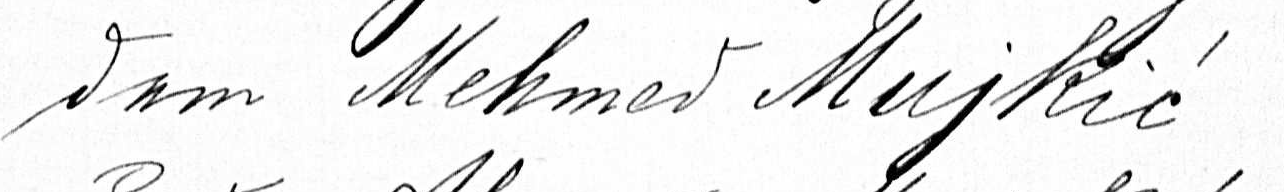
dem Mehmed Mujkić
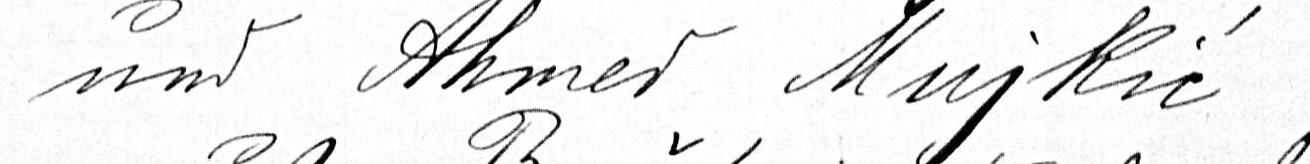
und Ahmer Mujkić
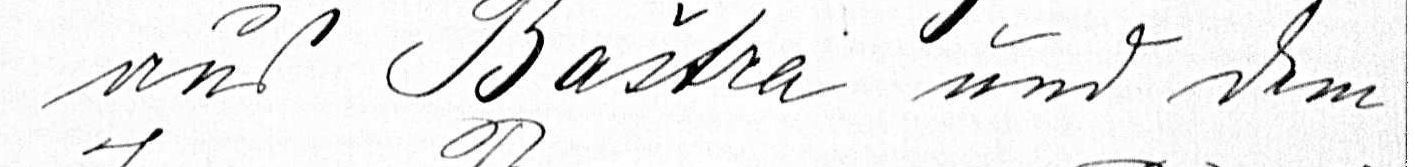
aus Baštra und dem
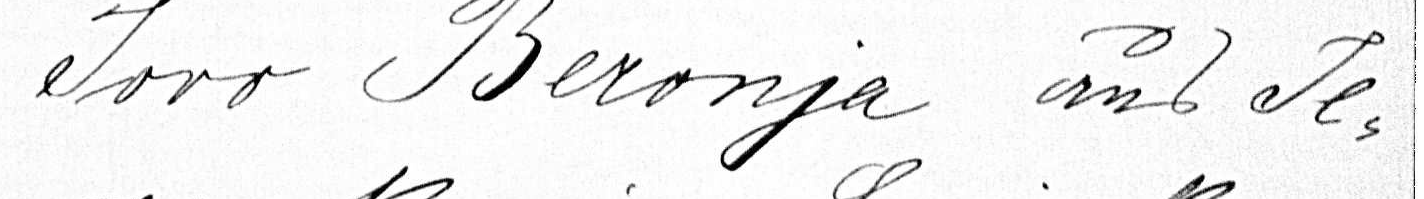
Jovo Beronja aus Je¬
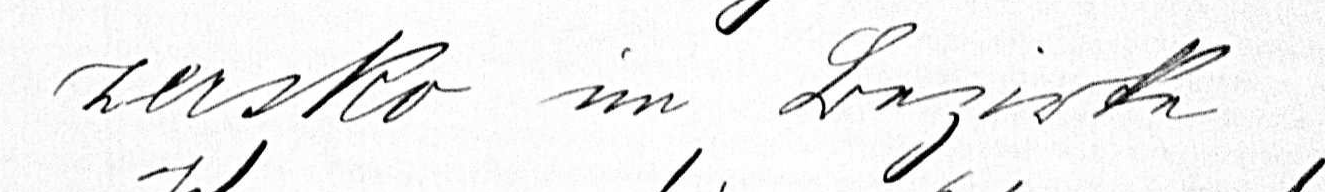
zersko im Bezirke
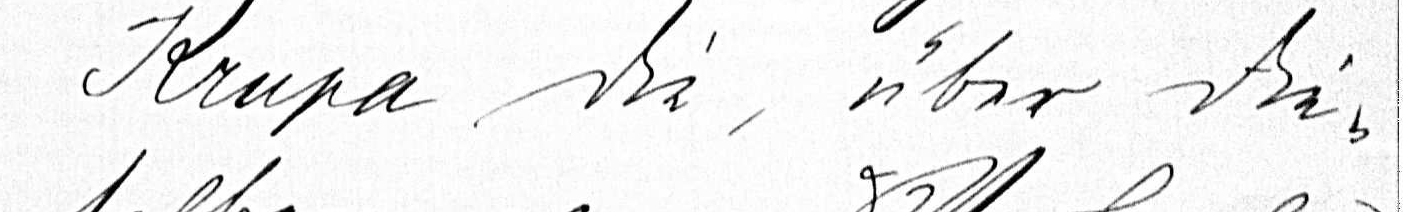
Krupa die, über die¬
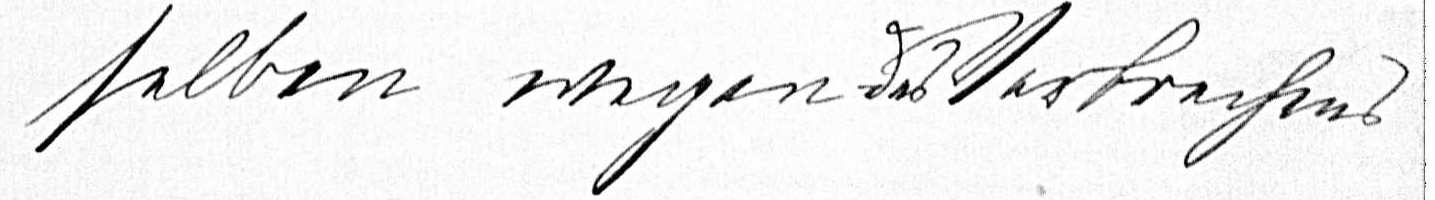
selben wegen des Verbrechens
